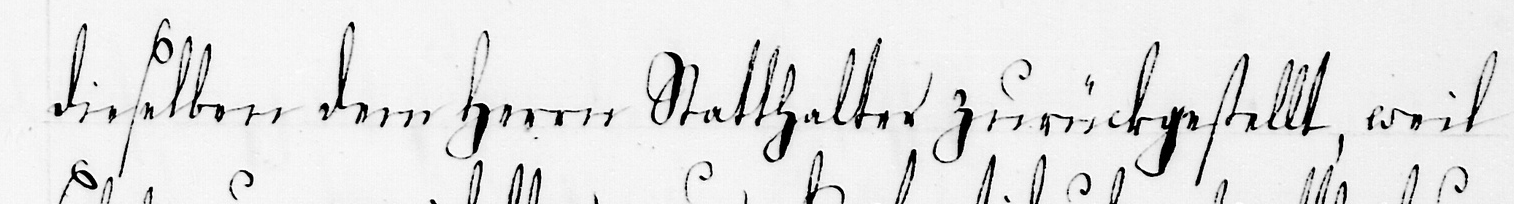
dieselben dem Herrn Statthalter zurückgestellt, weil
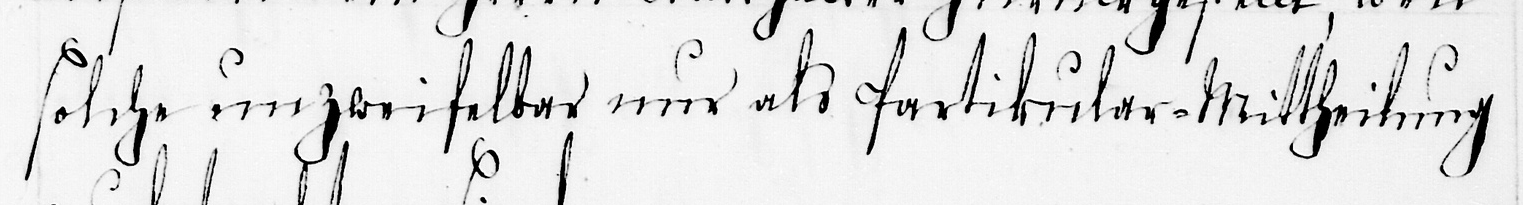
solche unzweifelbar nur als Partikular-Mittheilung
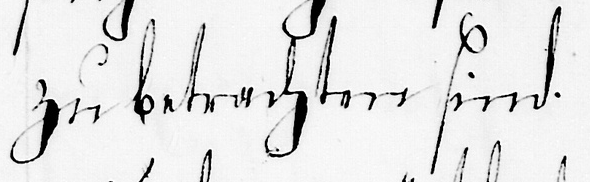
zu betrachten sind.
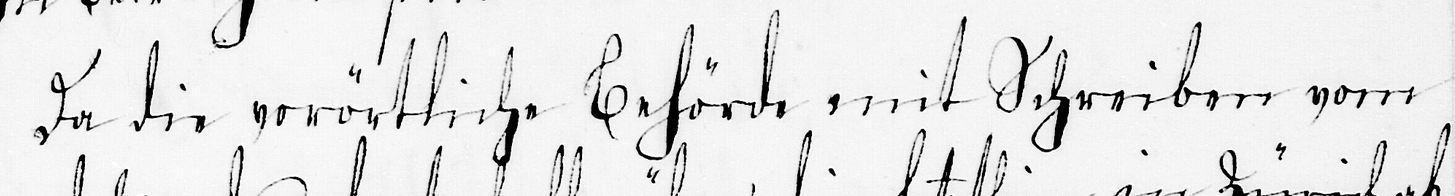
Da die vorörtliche Behörde mit Schreiben vom
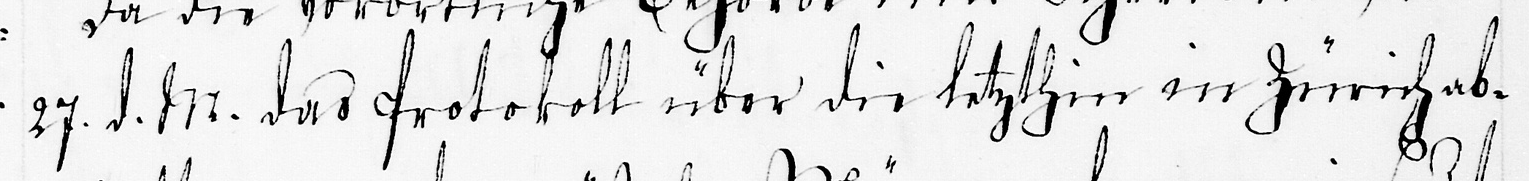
27. d. M. das Protokoll über die letzthin in Zürich ab¬
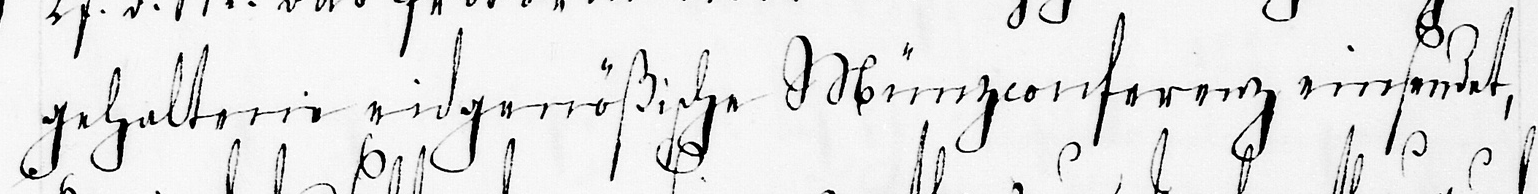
gehaltene eidgenößische Münzconferenz einsendet,
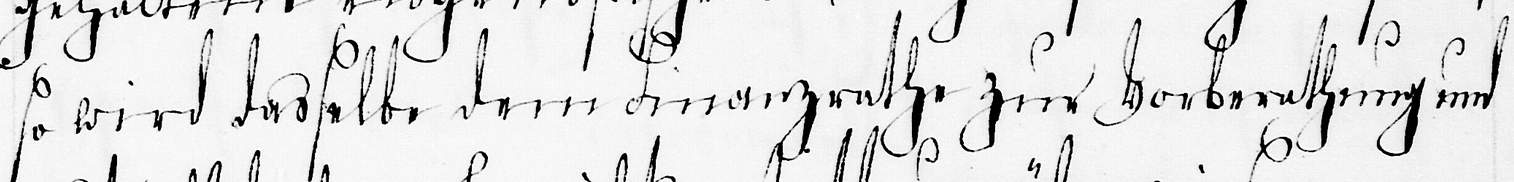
so wird dasselbe dem Finanzrathe zur Vorberathung und
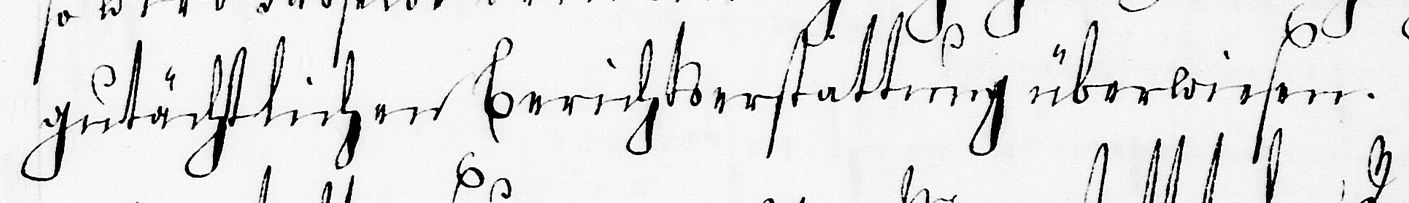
gutächtlichen Berichtserstattung überwiesen.
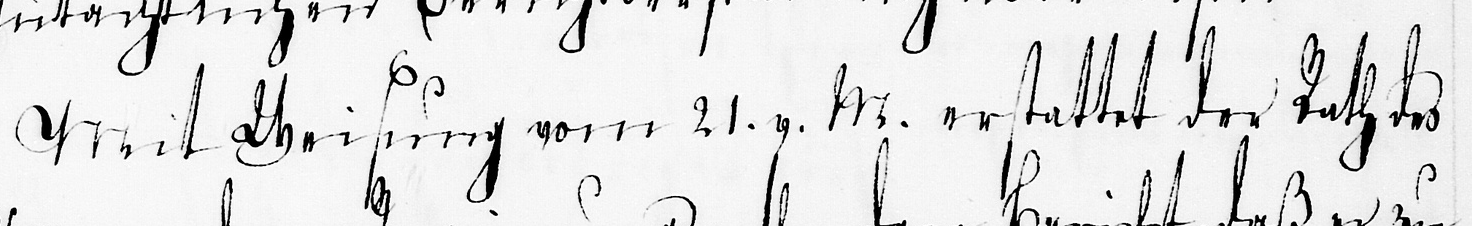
Mit Weisung vom 21. v. M. erstattet der Rath des
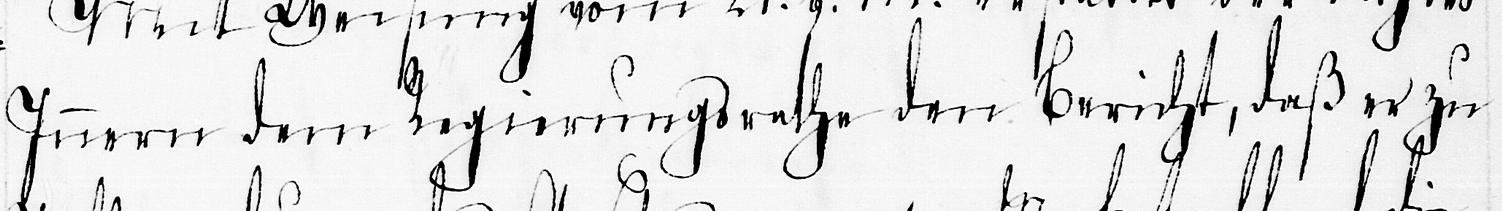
Innern dem Regierungsrathe den Bericht, daß er zu
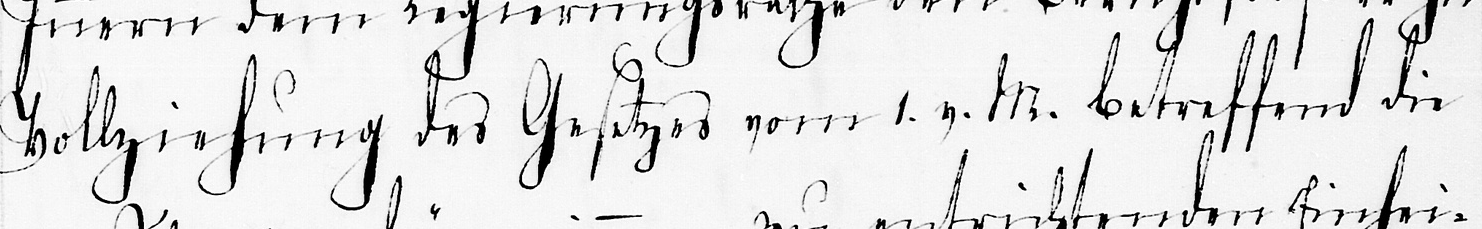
Vollziehung des Gesetzes vom 1. v. M. betreffend die
